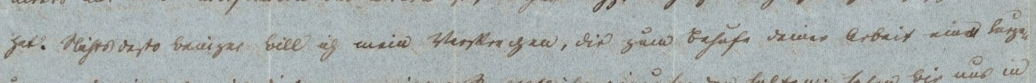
hat. Nichts desto weniger will ich mein Versprechen, dir zum Behufe deiner Arbeit einen kurzen
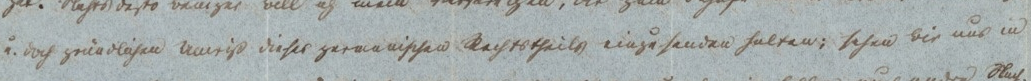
u. doch gründlichen Umriß dieses germanischen Rechtstheils einzusenden halten; sehen wir uns in
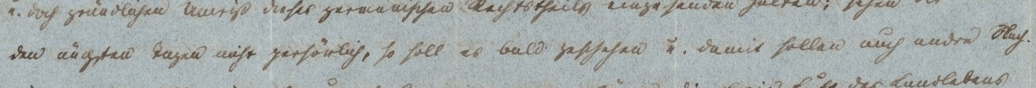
den nächsten Tagen nicht persönlich, so soll es bald geschehen u. damit sollen auch andre Nach-
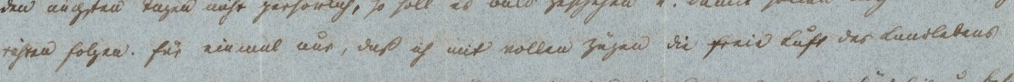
richten folgen. Für einmal nur, daß ich mit vollen Zügen die freie Luft des Landlebens
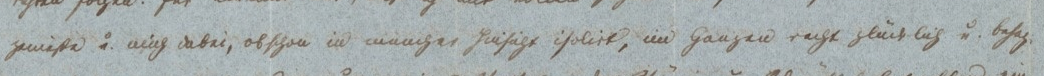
genieße u. mich dabei, obschon in mancher Hinsicht isolirt, im Ganzen recht glücklich u. behag-
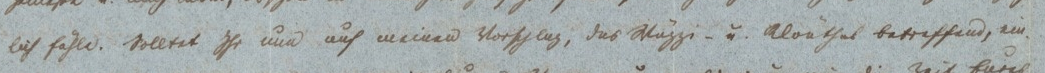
lich fühle. Solltet Ihr nun auf meinen Vorschlag, das Wäggi- u. Klönthal betreffend, ein-
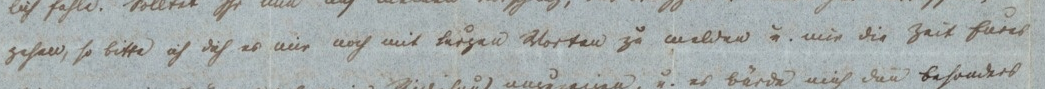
gehen, so bitte ich dich es mir noch mit kurzen Worten zu melden u. mir die Zeit Eures
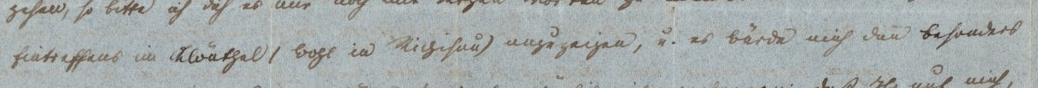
Eintreffens im Klönthal (wohl in Richisau) anzuzeigen, u. es würde mich dann besonders
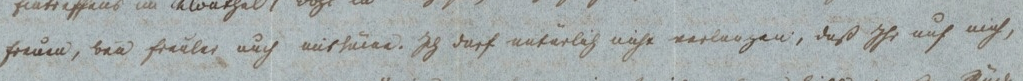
freuen, wenn Freuler auch mitkäme. Ich darf natürlich nicht verlangen, daß Ihr auf mich,
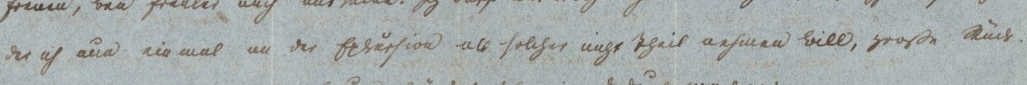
der ich nun einmal an der Exkursion als solches nicht Theil nehmen will, große Rück-
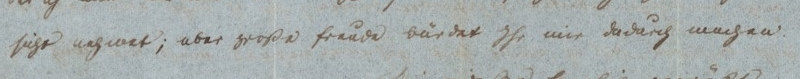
sicht nehmet; aber große Freude würdet Ihr mir dadurch machen.
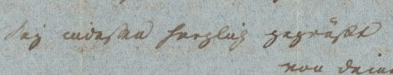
Sey indessen herzlich gegrüßt
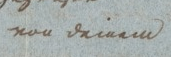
von deinem
